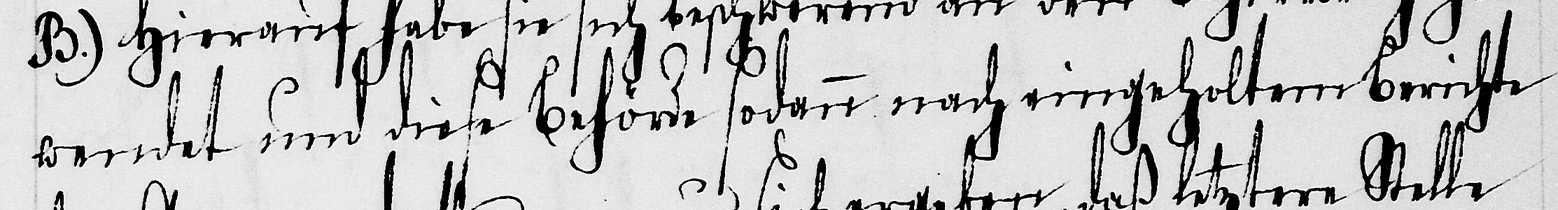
wendet und diese Behörde sodann nach eingeholtem Berichte
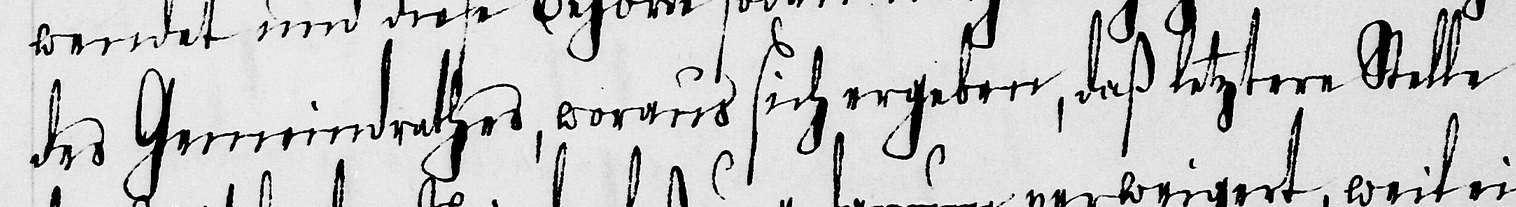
des Gemeindrathes, woraus sich ergeben, daß letztere Stelle
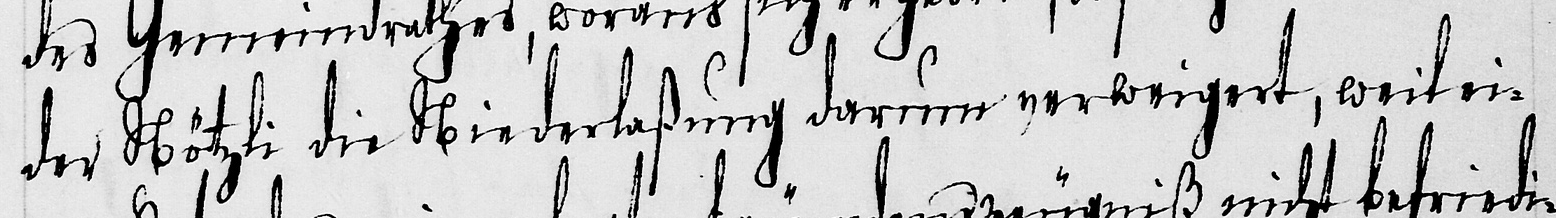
der Nötzli die Niederlaßung darum verweigert, weil ei¬
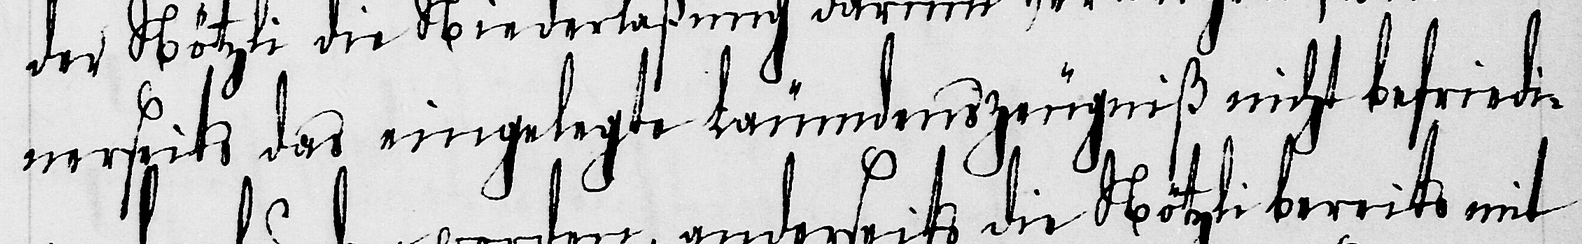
nerseits das eingelegte Läumdenszeugniß nicht befriedi¬
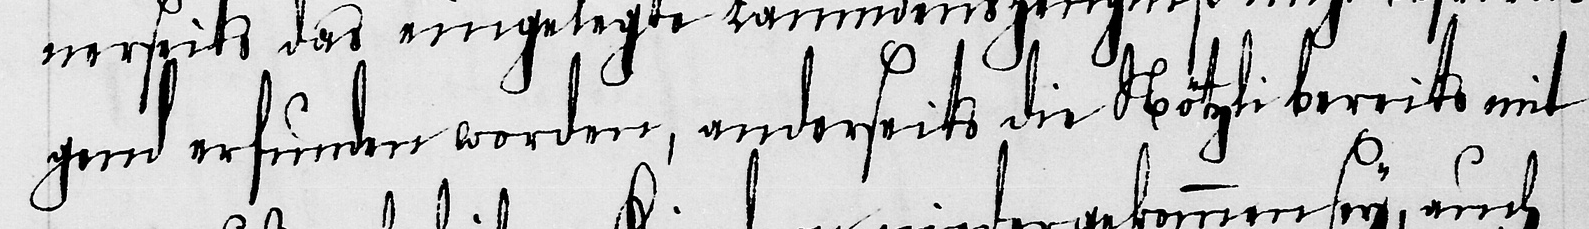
gend erfunden worden, anderseits die Nötzli bereits mit
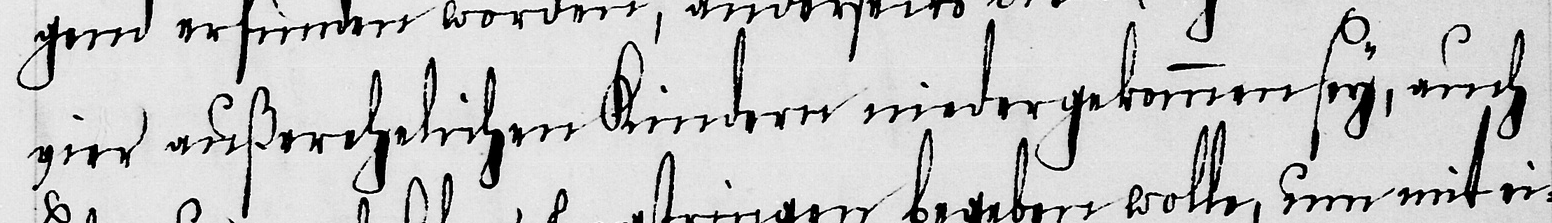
vier außerehelichen Kindern niedergekommen sey, auch
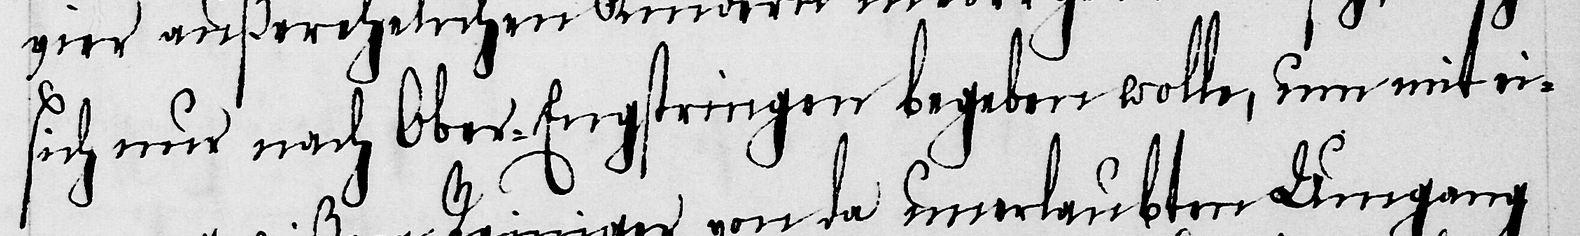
sich nur nach Ober-Engstringen begeben wolle, um mit ei¬
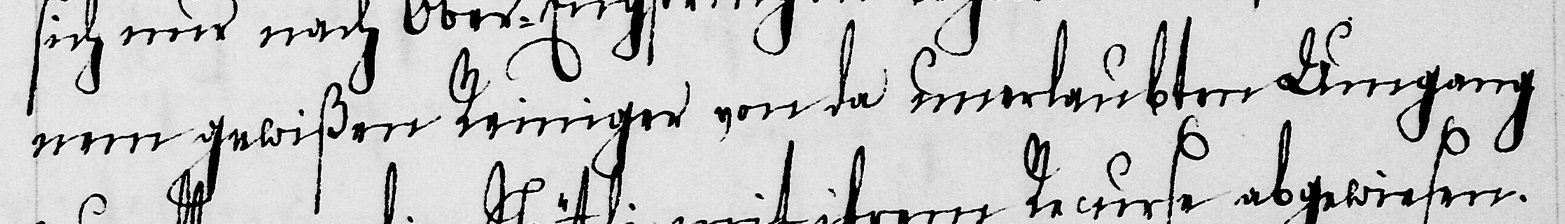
nem gewißen Reiniger von da unerlaubten Umgang
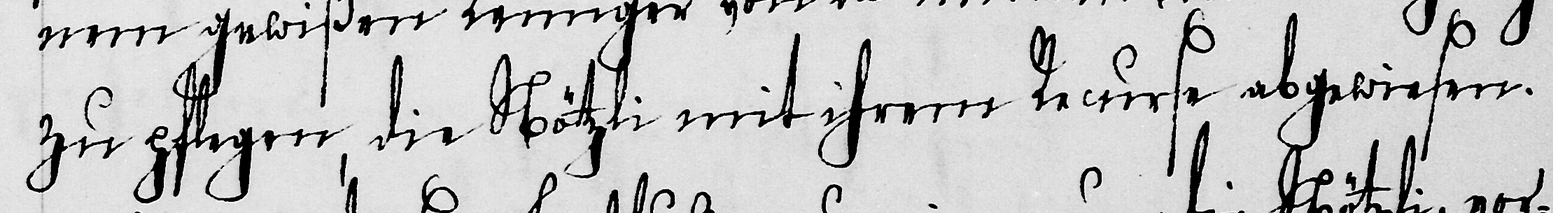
zu pflegen, die Nötzli mit ihrem Recurse abgewiesen.
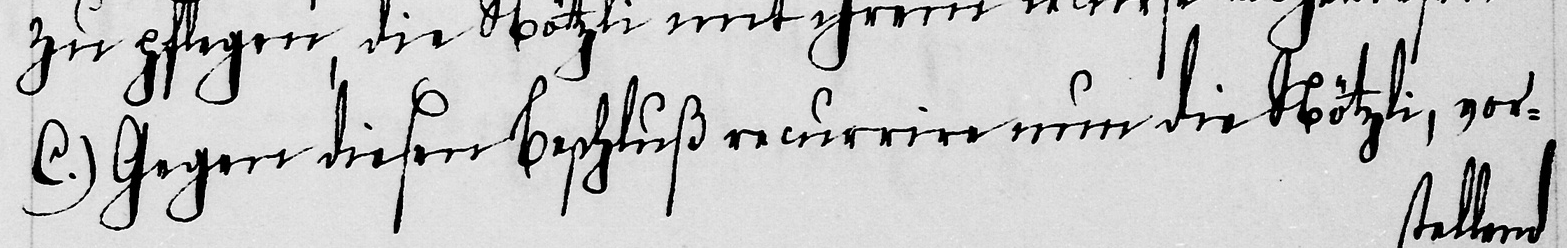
C.) Gegen diesen Beschluß recurrire nun die Nötzli, vor-
